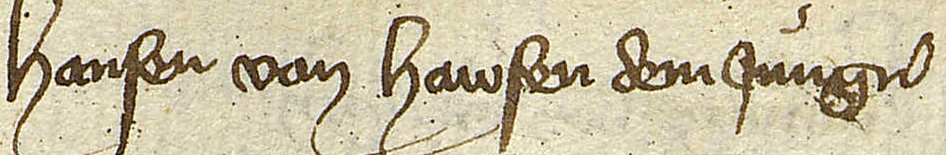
hanſen von hawſen dem Iüngn*
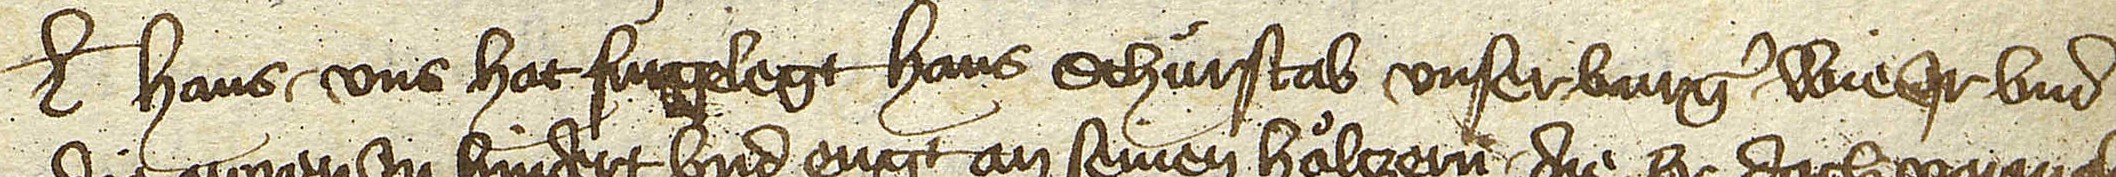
L* hans / vns hat fürgelegt hans Schürſtab vnſer burg* / wie Ir vnd
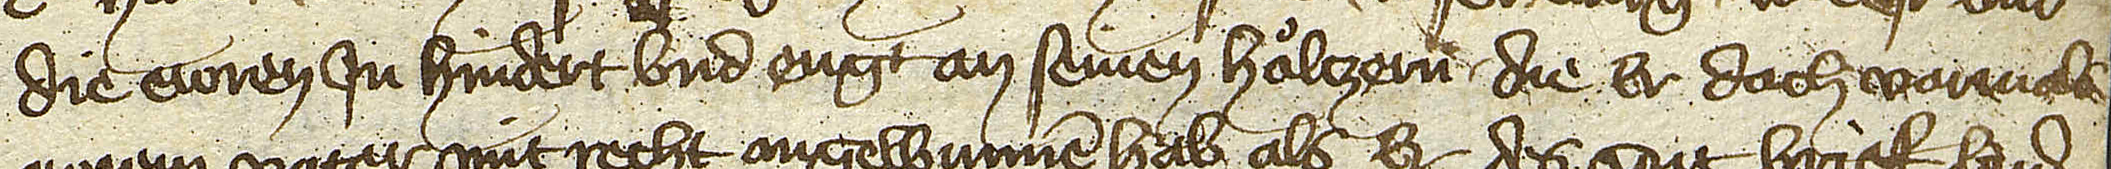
die ewren In hindert vnd engt an ſeinen hölcʒern / die Er doch vormals
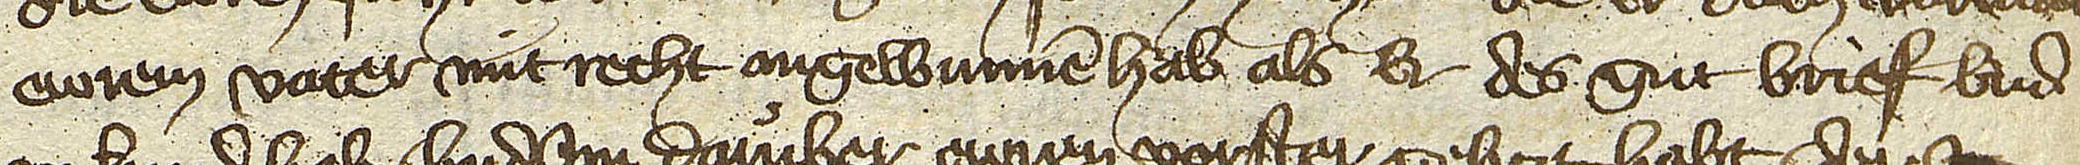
ewrem vater mit recht angewunne* hab als Er des gut brief vnd
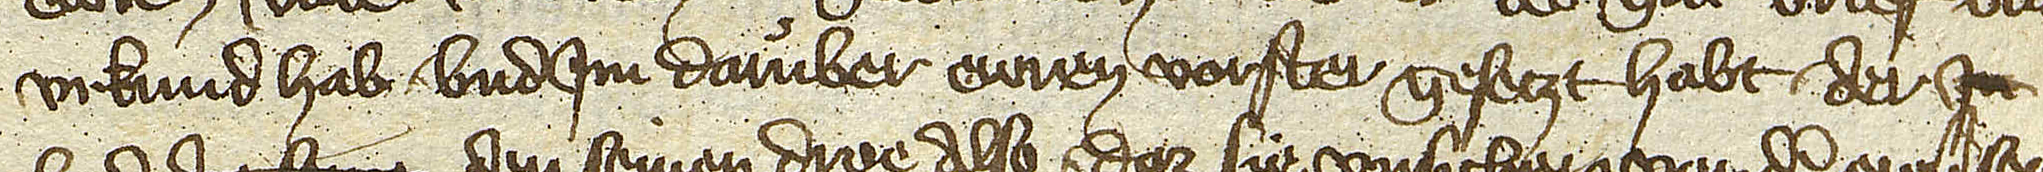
vrkund hab / vnd Im darüber ewren vorſter geſecʒt habt / der In
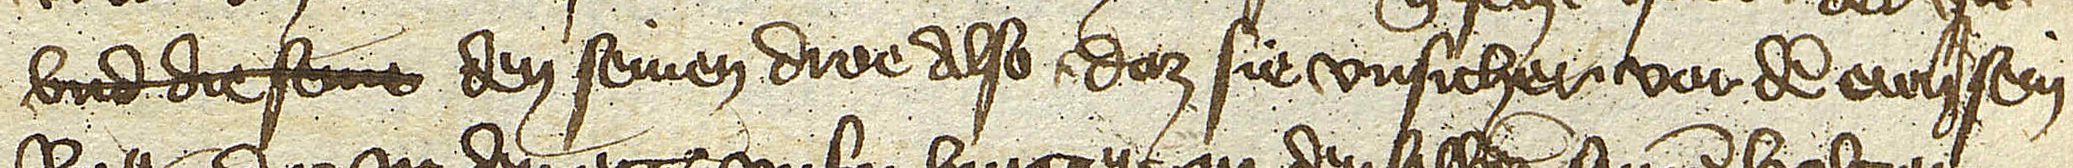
vnd die ſeine den ſeinen droe Alſo / daʒ ſie vnſicher vor d* ewn* ſein
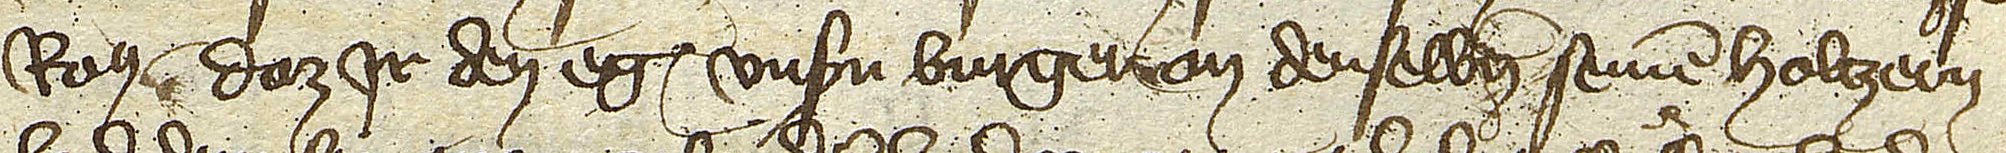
Ro* / daʒ Ir den eg* vnſ*n burger an denſelbn* ſeine* holcʒern
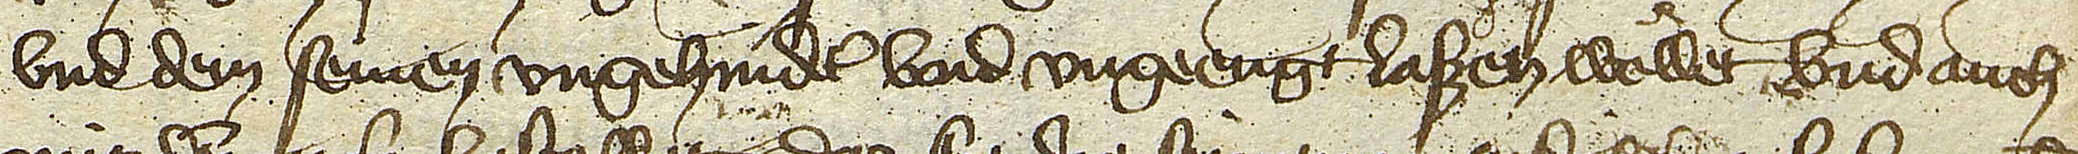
vnd dem ſeinen vngehind* vnd vngeengt laſʒen wöllet vnd auch
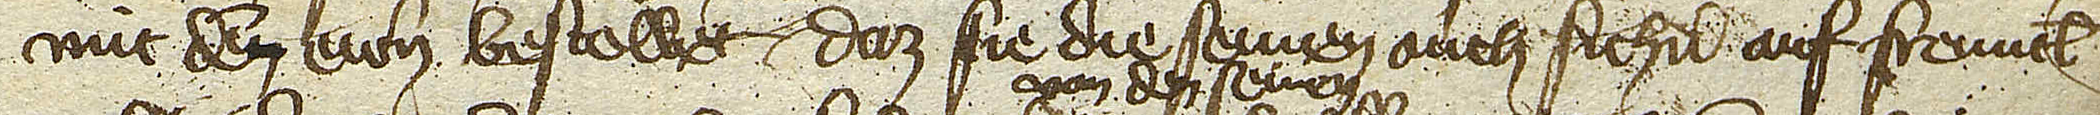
mit de*n ewn* beſtellet / daʒ ſie die ſeinen auch ſichn* auf freuntl*
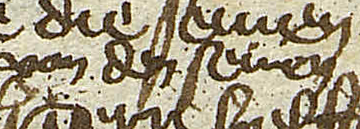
von den ſeinen
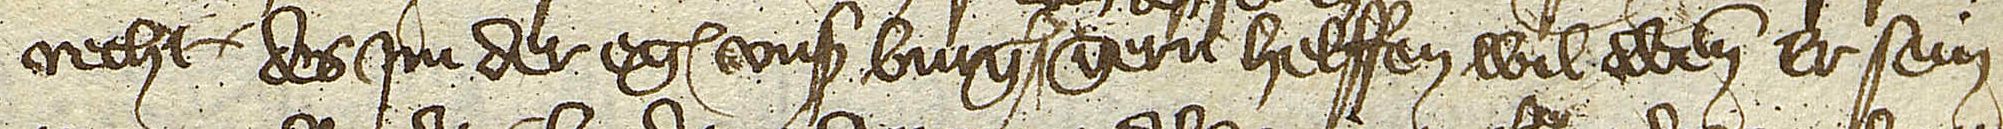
recht / des Im der eg* vnſ* burg* gern helffen wil wen* Er ſein
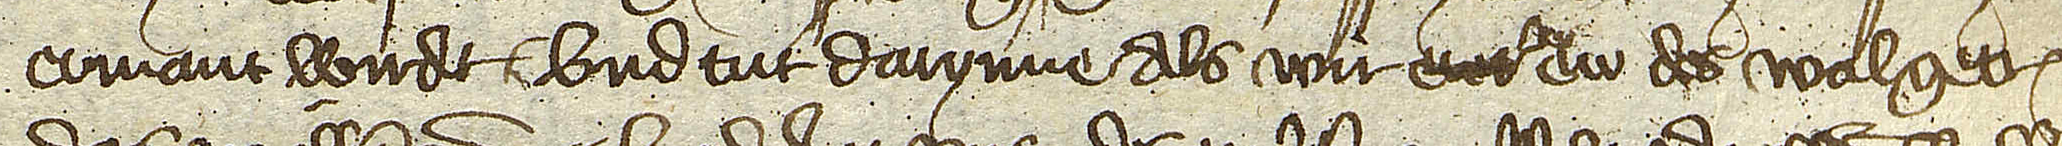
ermant wirdt / vnd tut darynne / Als wir ewr* ew des wol getr*
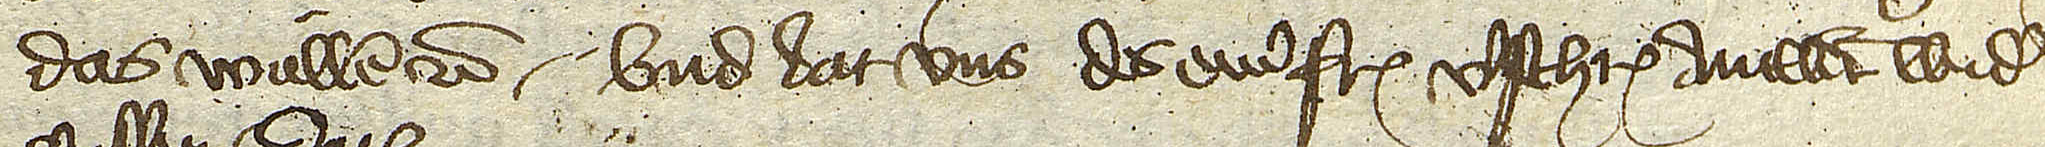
das wölle* ec* / vnd lat vns des ew* fr* v*ſchr* Antwt* wid*
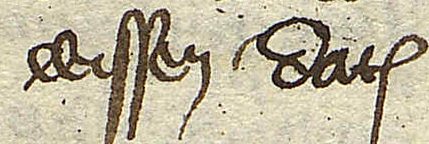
wiſſen / dat*
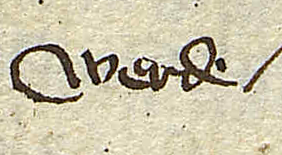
werde /
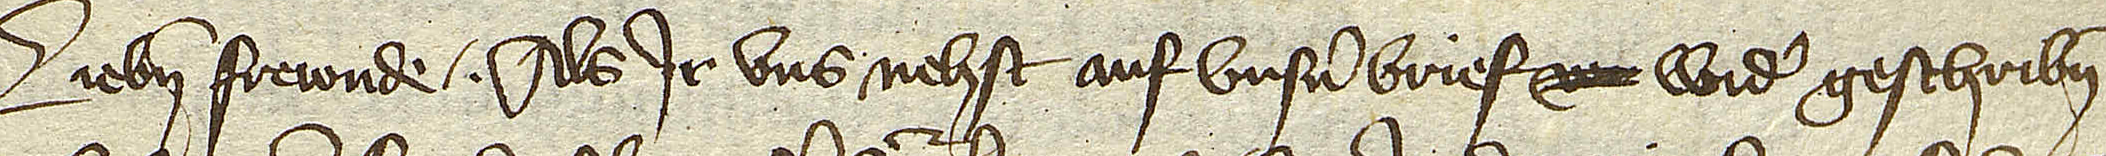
Liebn* frewnde* / . Als Ir vns nehſt auf vnſn* brief w wid* geſchribn*
